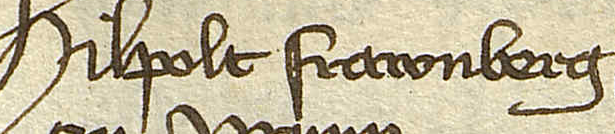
Hilpolt frawnberg*
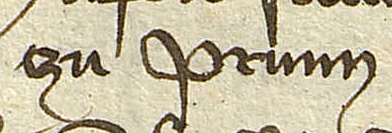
cʒu Prunn
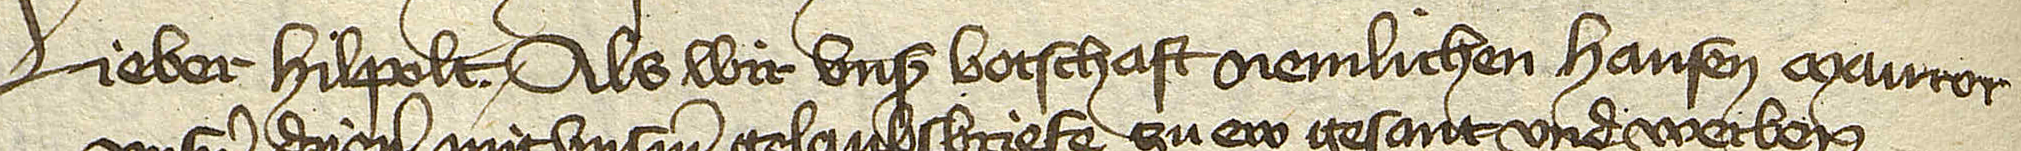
Lieber hilpolt . / Als wir vnſ* botſchaft nemlichen hanſen Maurer
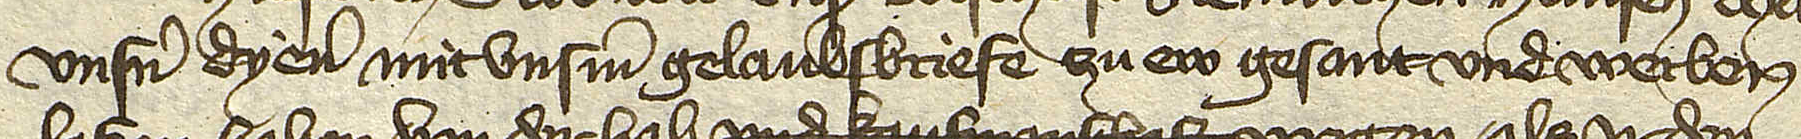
vnſn* dyen* mit vnſm* gelaubſbriefe cʒu ew geſant vnd werben
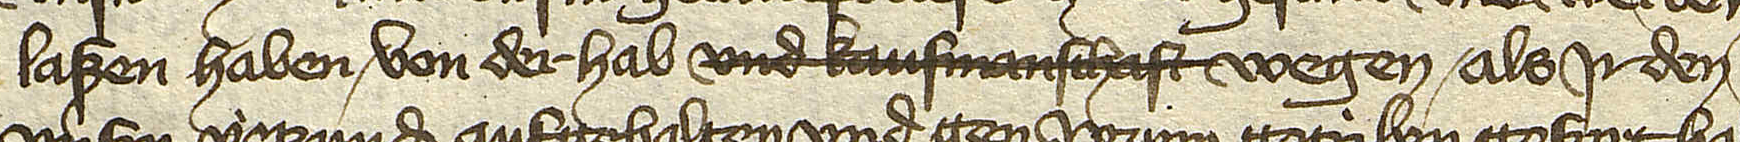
laſʒen haben / von der hab vnd kaufmanſchaft wegen / als Ir den
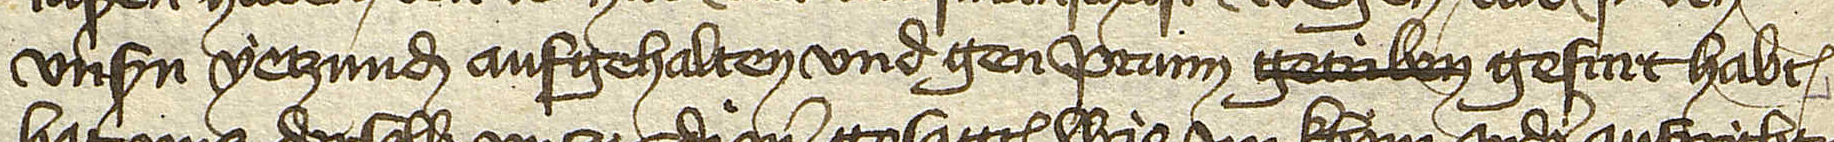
vnſ*n yecʒund* aufgehalten vnd gen Prunn getriben gefurt habt*
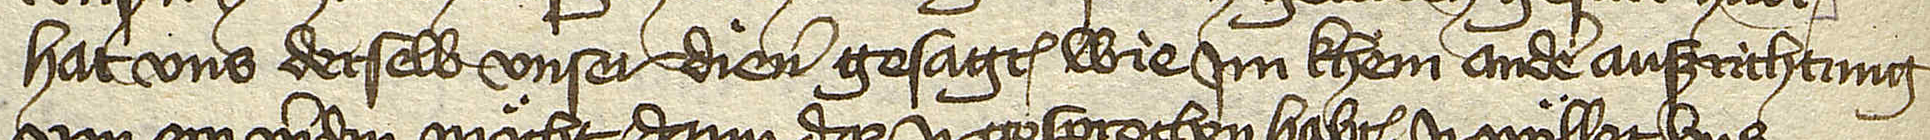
hat vns derſelb vnſer dien* geſagt* wie Im khein ande* auſʒrichtung
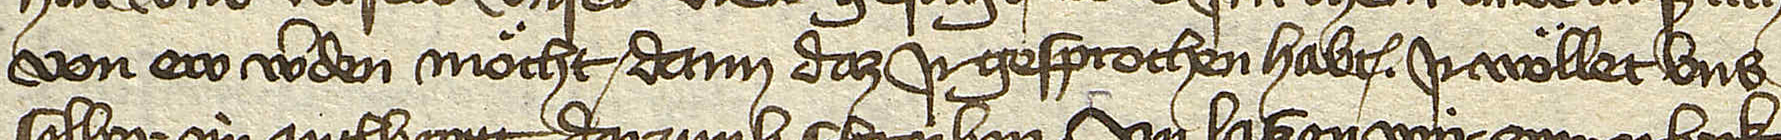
von ew w*den möcht / dann daʒ Ir geſprochen habt* . Ir wöllet vns
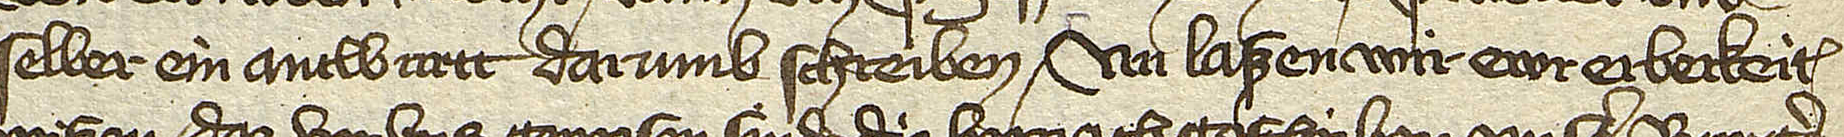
ſelber ein antwurtt darumb ſchreiben / Nu laſʒen wir ewr erberkeit*
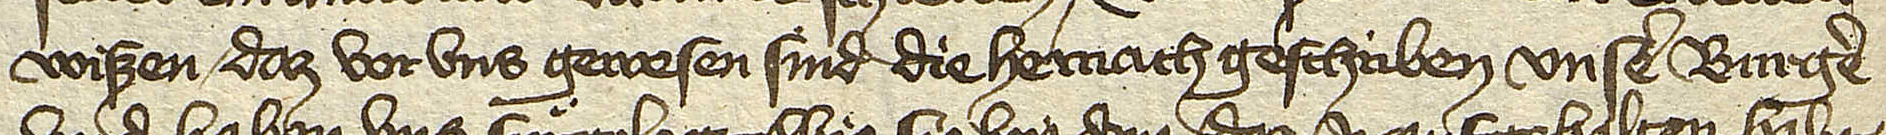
wiſʒen / daʒ vor vns geweſen ſind die hernach geſchriben vnſe* Burge*
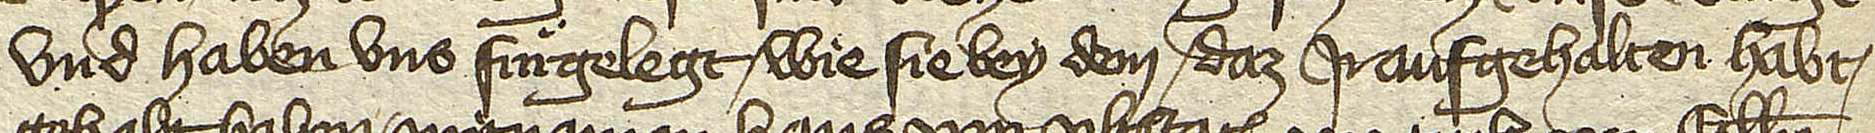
vnd haben vns fürgelegt / wie ſie bey dem / daʒ Ir aufgehalten habt /
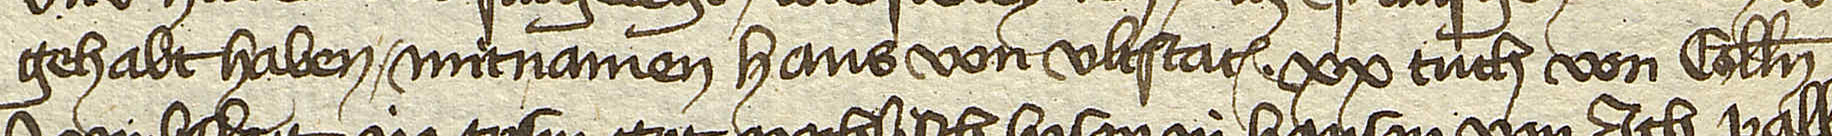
gehabt haben / mitnamen hans von vltſtat* . xx tuch von Colln*
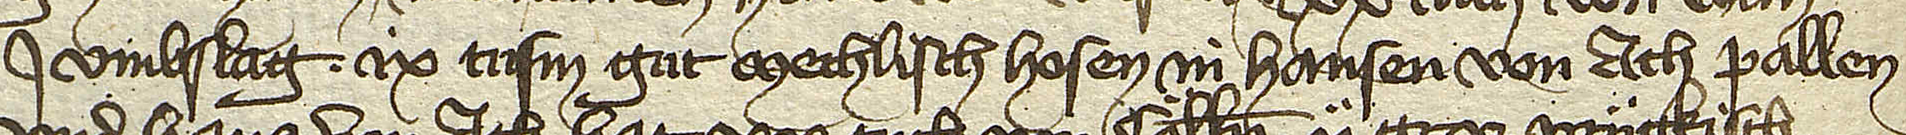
I vmbſlag ix tuſin gut Mechliſch hoſen in hanſen von Ach pallen
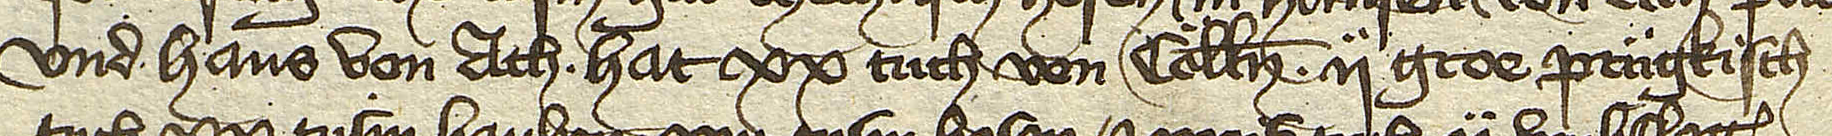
vnd hans von Ach . hat xx tuch von Cölln*. ii groe prügkiſch
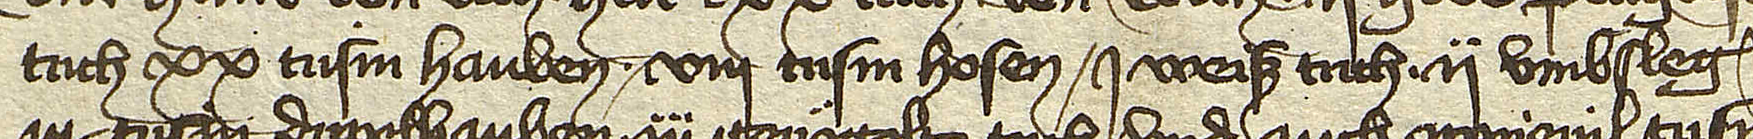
tuch xx tuſin hauben . / viii tuſin hoſen / I weiſʒ tuch . ii vmbſleg*
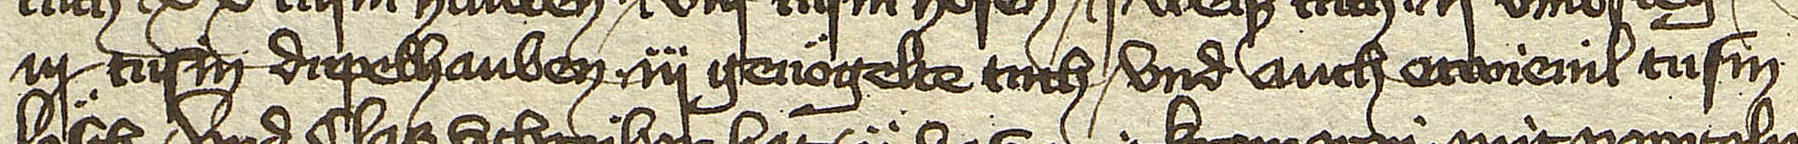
iii tuſin dupelhauben . iii genögelte tuch / vnd auch etwieuil tuſin
